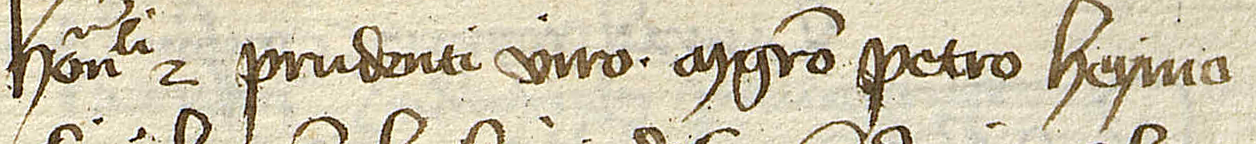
Hon*li @ prudenti viro . M*g*ro Petro Heymo
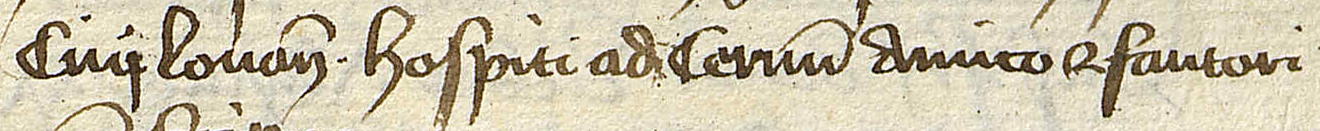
Ciui Louan* . hoſpiti ad Ceruu* Amico @ fautori
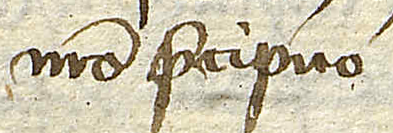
n*ro p*cipuo
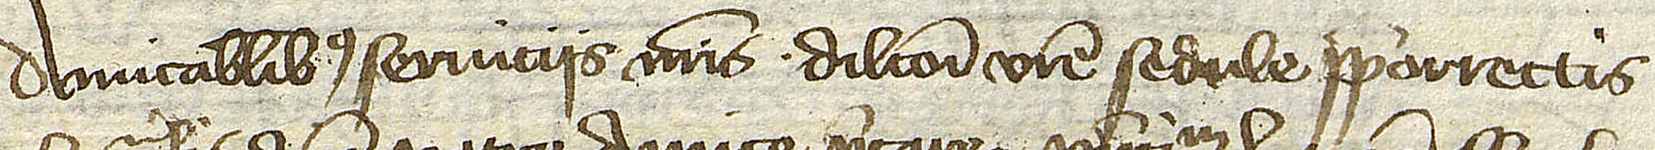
Amicab*lib* ſeruiciis n*ris dil*c*o*i v*re ſedule p*porrectis
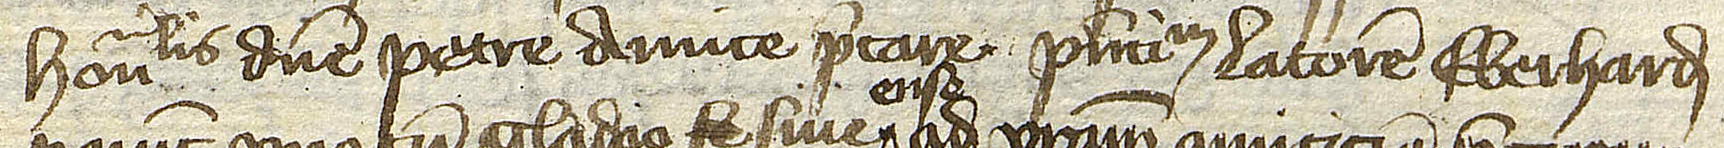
hon*lis d*ne Petre Amice p*care p*nci* latore* Eberhard*
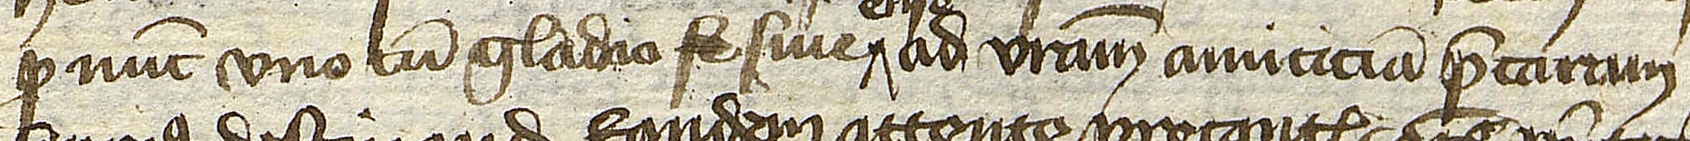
p* nu*c vno cu* gladio ſe ſiue ad v*ram amicicia* p*caram
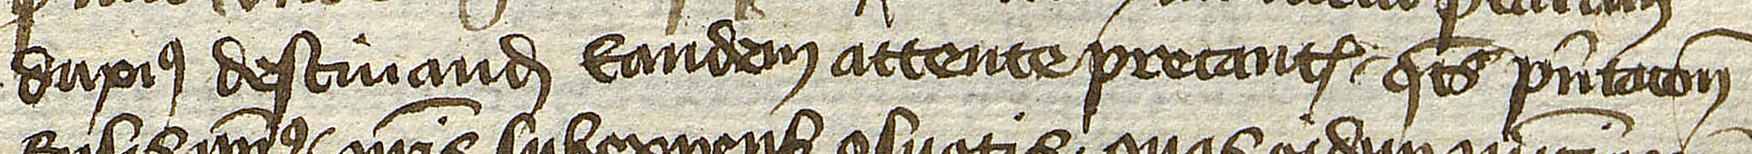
duxi* deſtinand* Eandem attente precant* / q*t*s p*ntac*on*
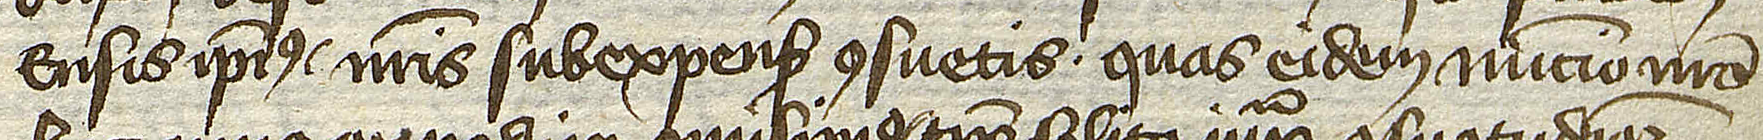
Enſis ip*i* / n*ris ſubexpenſ* *ſuetis . quas eidem nu*cio n*ro
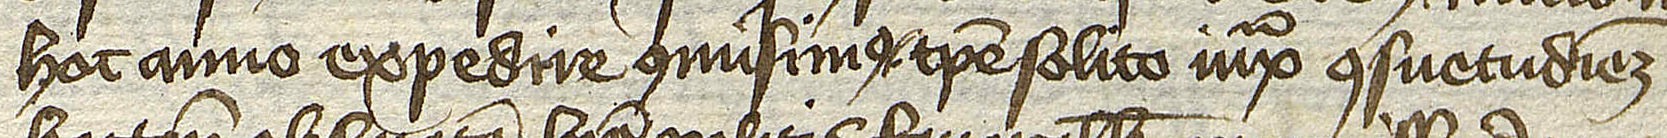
hoc anno expedire *miſim* . t*p*e ſolito iux* *ſuetudi*e
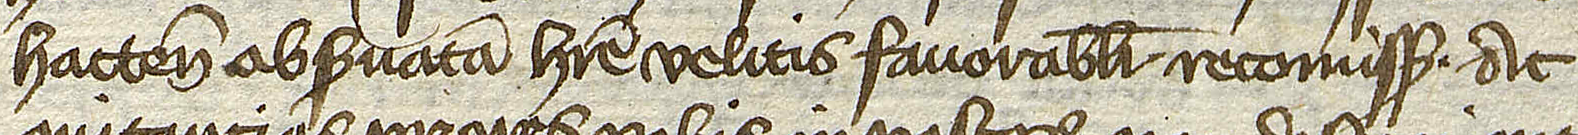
Hacten* obſ*uata* h*re velitis fauorab*l*r recomiſſ* . / Ac
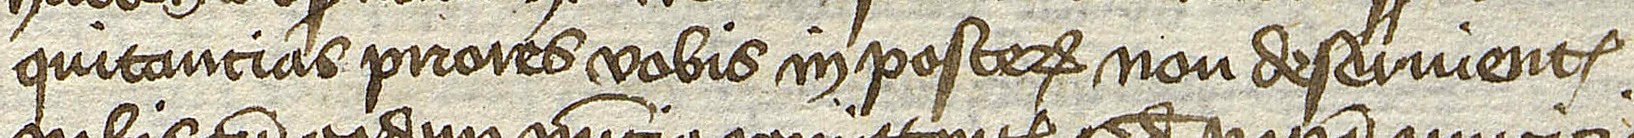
quitancias priores vobis in poſter* non deſeruient*
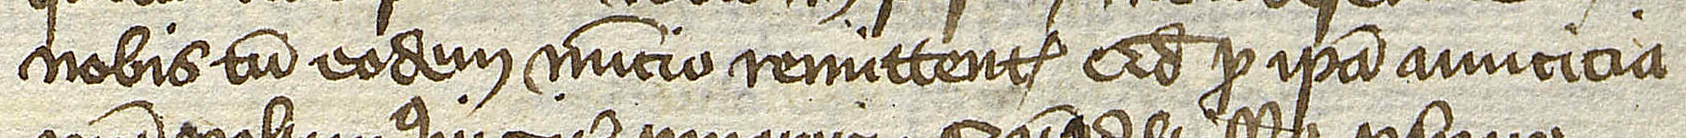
nobis cu* eodem nu*cio remittent* Qd* P* ip*a amicicia
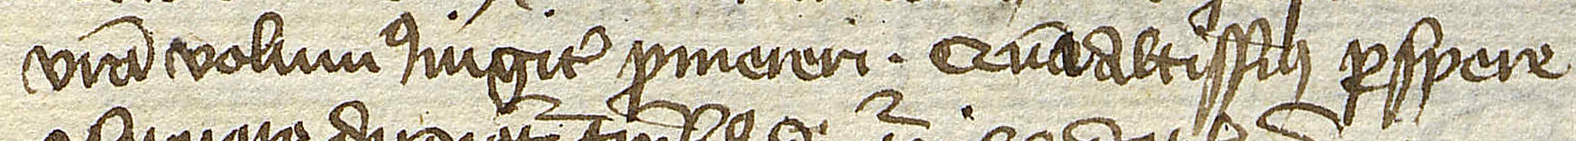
v*ra volum* *iugit* p*mereri . Quam Altiſſi* p*ſpere
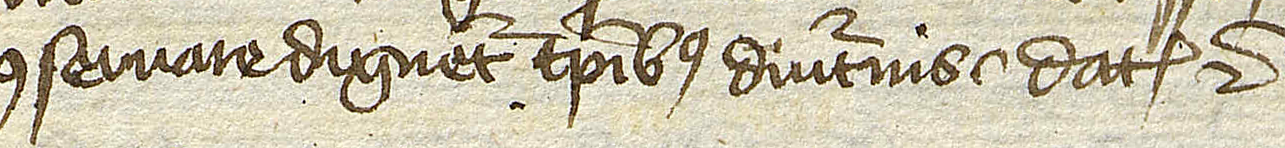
*ſeruare dignet* t*p*ib* diut*nis / Dat* ec*
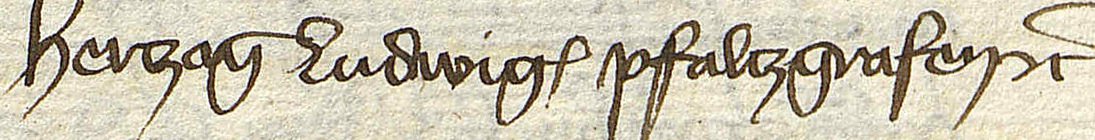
Hercʒog ludwig* pfalcʒgrafen ec*
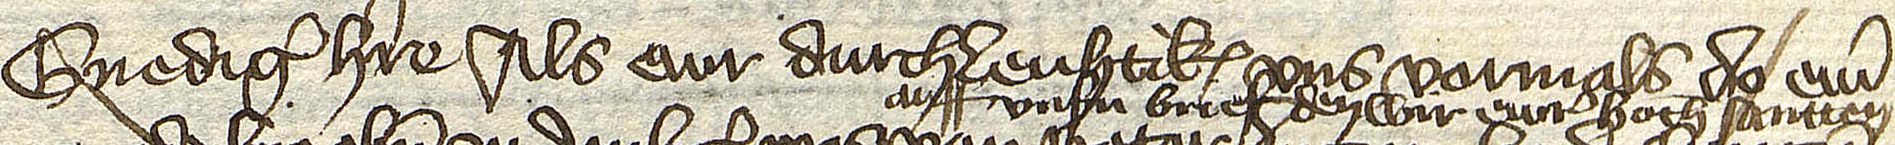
Gnedig* h*re Als ewr durchleuhtik* vns vormals do ew*
